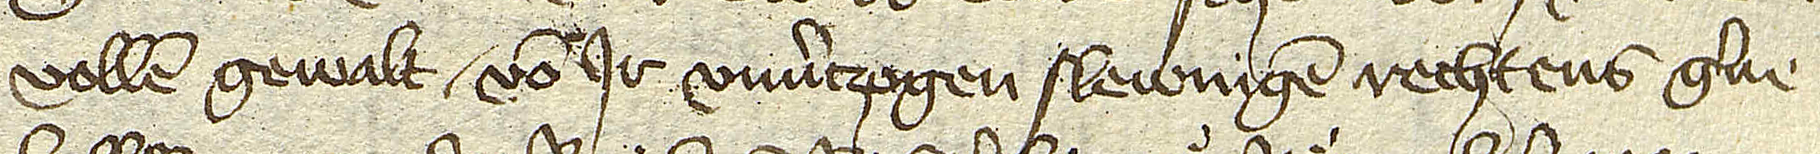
volle* gewalt / vo* Ir vnu*cʒogen ſlewnige* rechtens g*ne
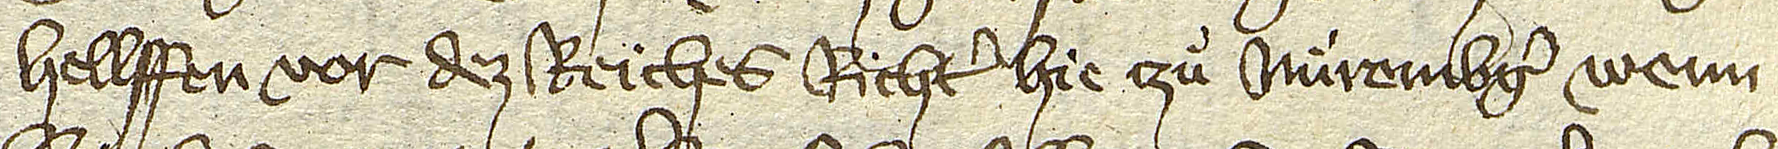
helffen vor deʒ Reiches Richt* hie cʒü Nürembg* wenn
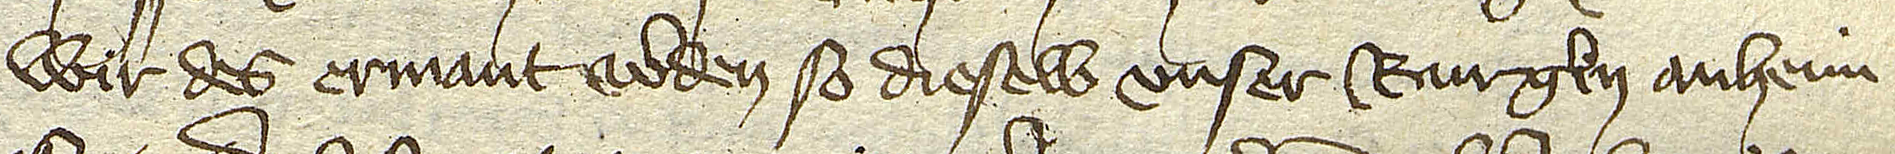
wir des ermant w*den ſo dieſelb vnſer Burg*in anheim
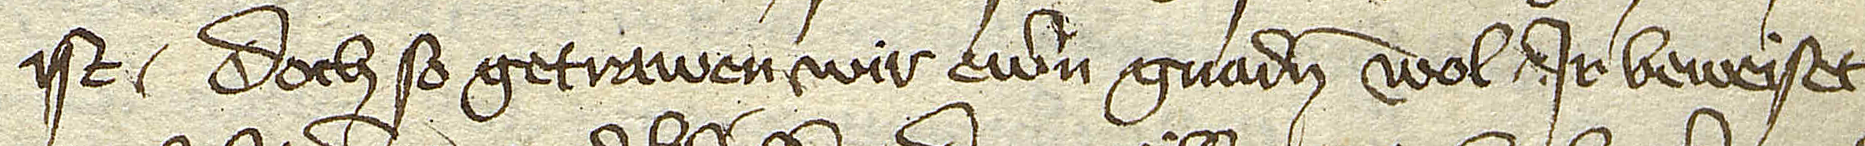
iſt / Doch ſo getrawen wir ew*n gnadn* wol / . Ir beweiſet
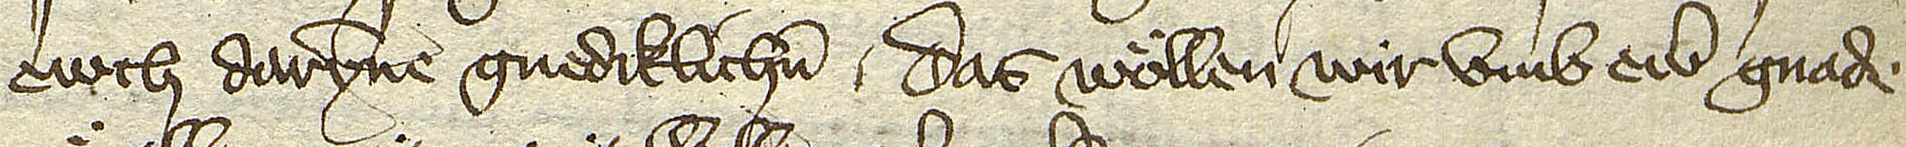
ewch daryne* gnediklichn* / Das wöllen wir vmb ew* gnade
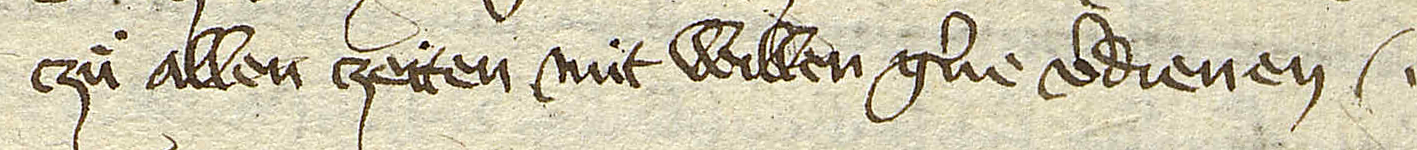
cʒü allen cʒeiten mit willen g*ne v*dienen / .
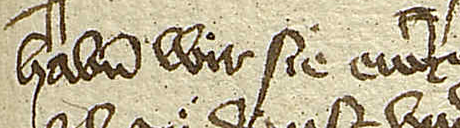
habn* wir ſie ewr*
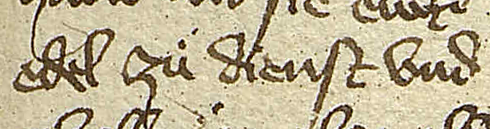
edel cʒü dienſt vnd
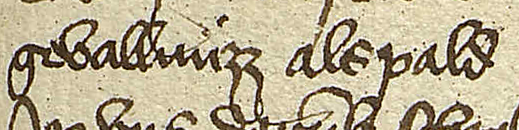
gevallnüʒʒ als pald
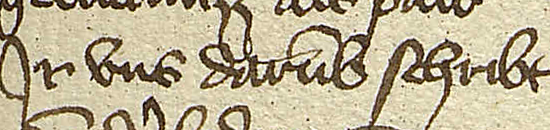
Ir vns darub* ſchribt
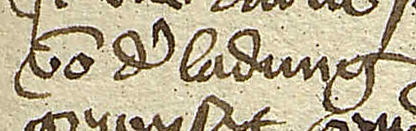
vo* d* ladung
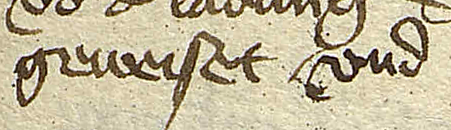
geweiſet / vnd
